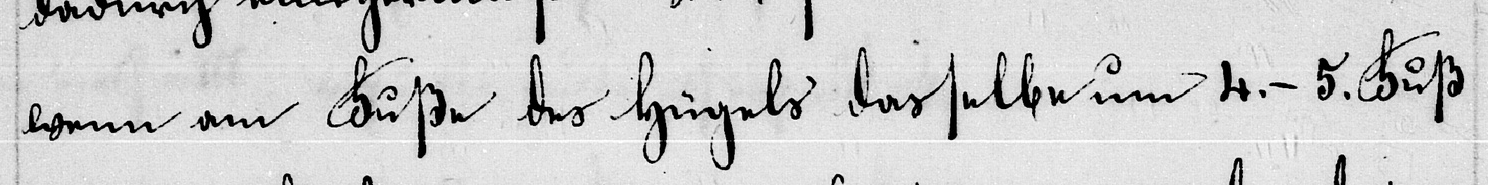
wenn am Fuße des Hügels dasselbe um 4.–5. Fuß
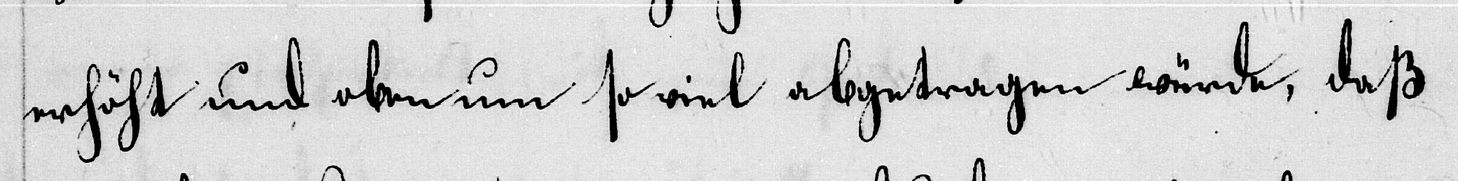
erhöht und oben um so viel abgetragen würde, daß
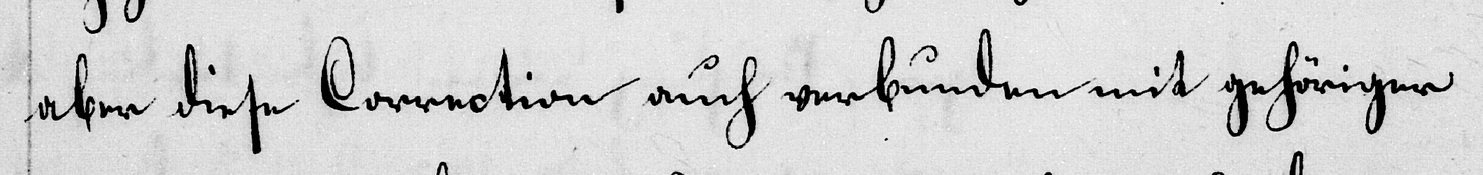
aber diese Correction auch verbunden mit gehöriger
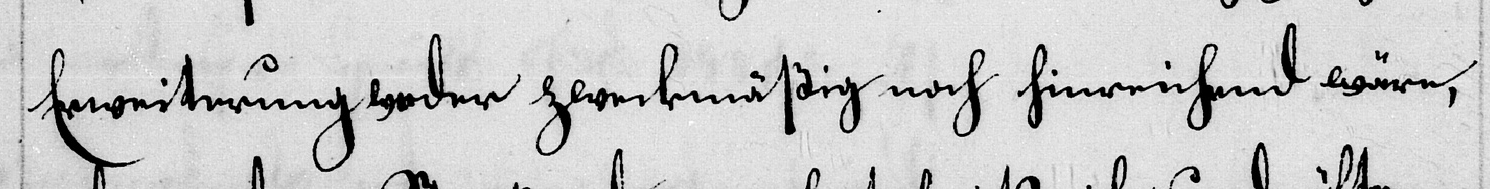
Erweiterung weder zweckmäßig noch hinreichend wären,
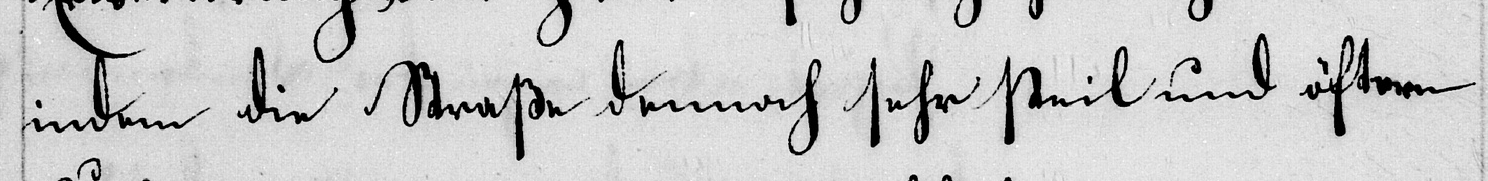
indem die Straße danach sehr steil und öftern
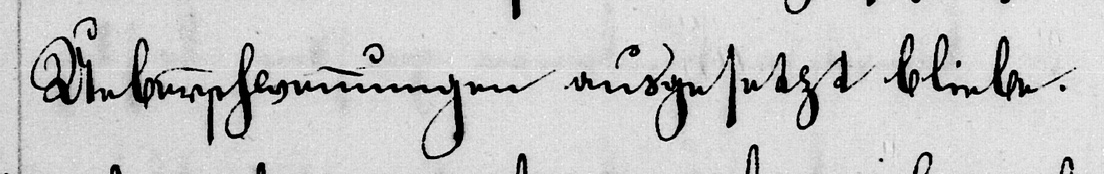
Ueberschwemmungen ausgesetzt bliebe.
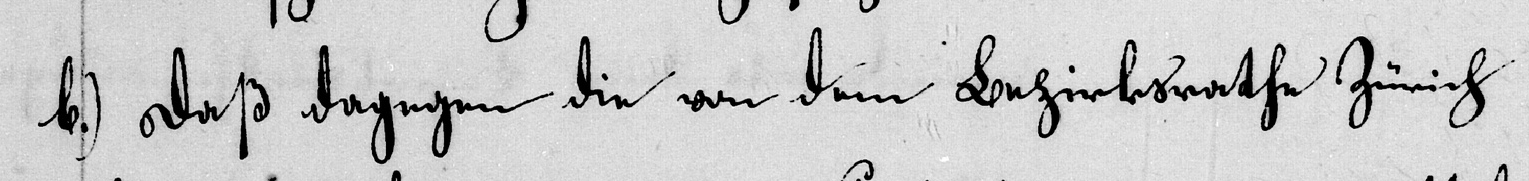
b.) Daß dagegen die von dem Bezirksrath Zürich
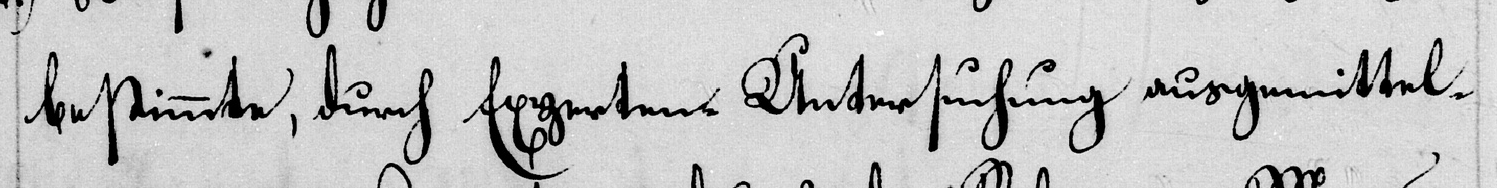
bestimmte, durch Experten-Untersuchung ausgemittel¬
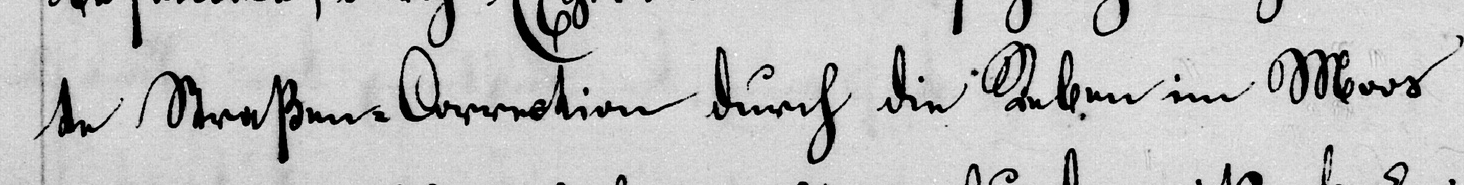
te Straßen-Correction durch die Reben im Moos
